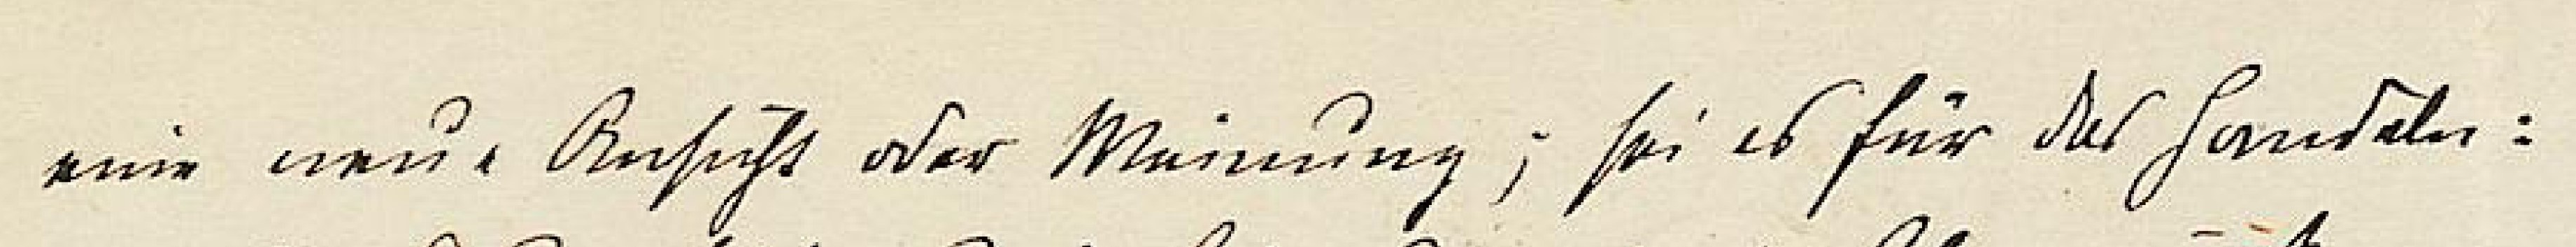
eine neue Ansicht oder Meinung, sei es für das Handeln:
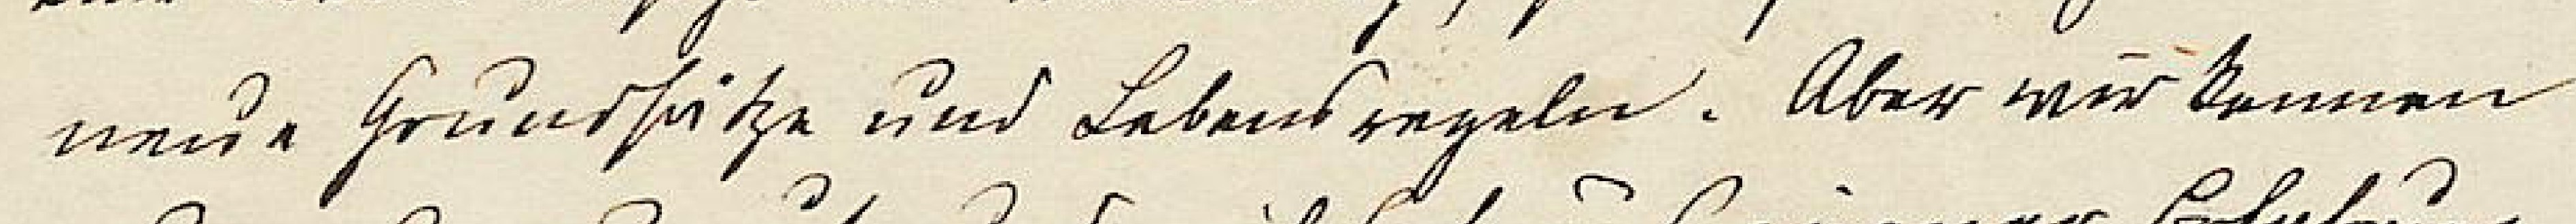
neue Grunsätze und Lebensregelen. Aber wir kennen
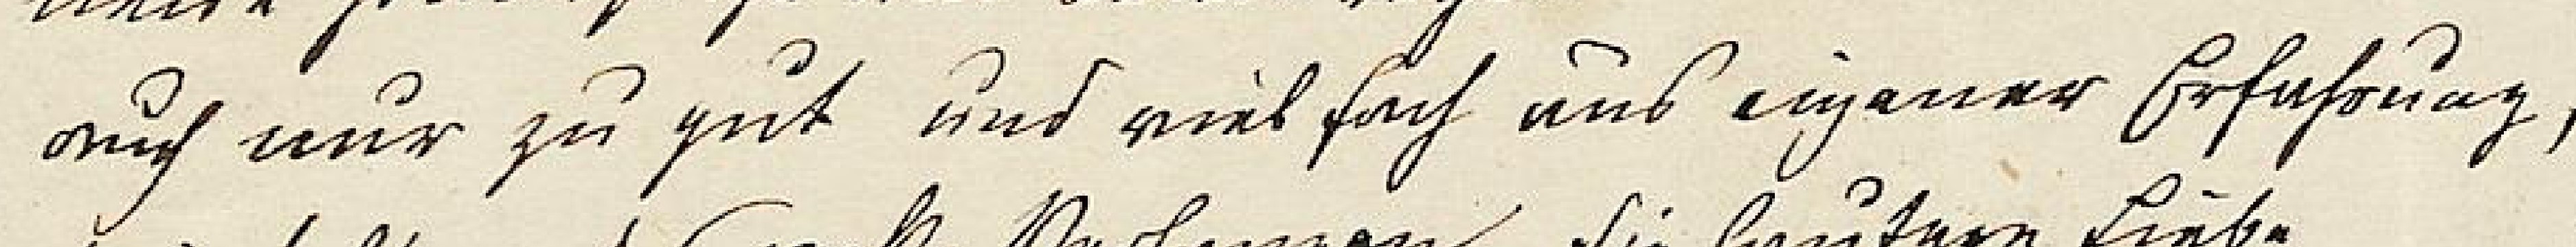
auch nur zu gut und vielfach aus eigener Erfahrung,
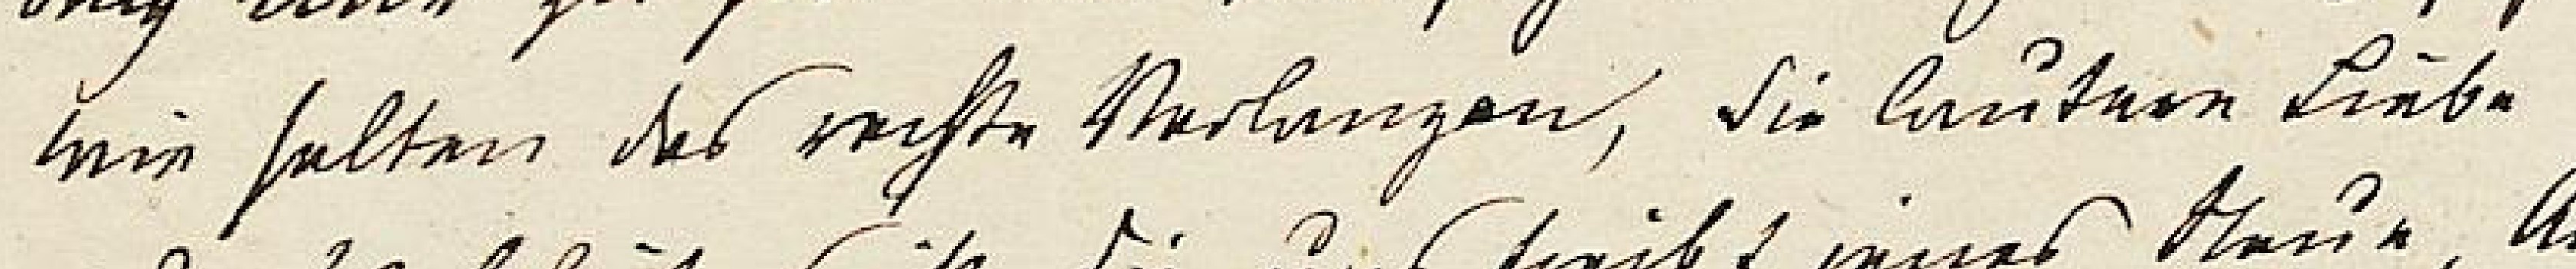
wie selten das rechte Verlangen, die lautere Liebe
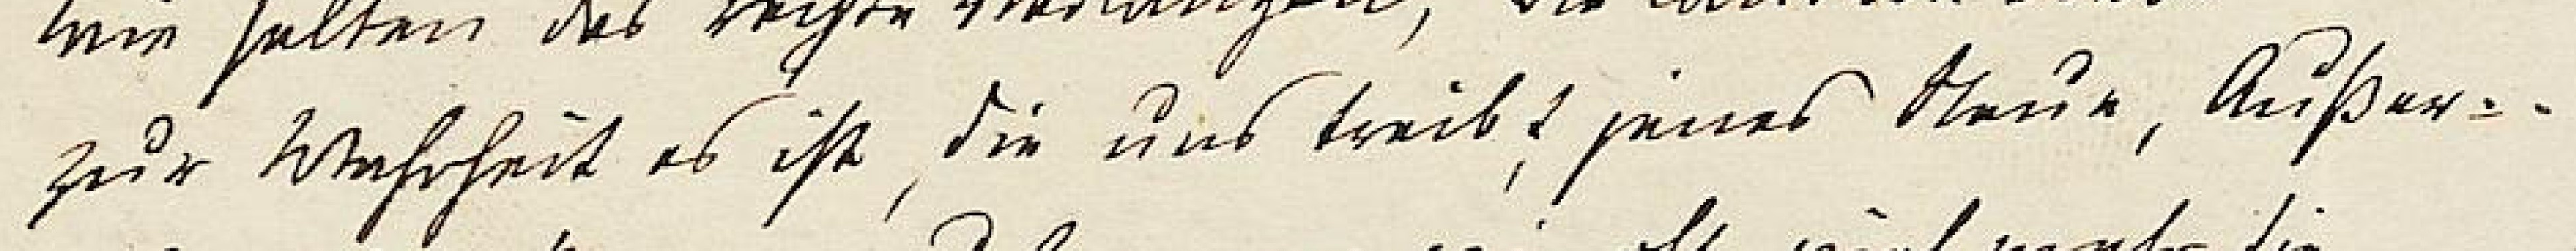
zur Wahrheit es ist, die uns treibet, jenes Neue, Außer¬
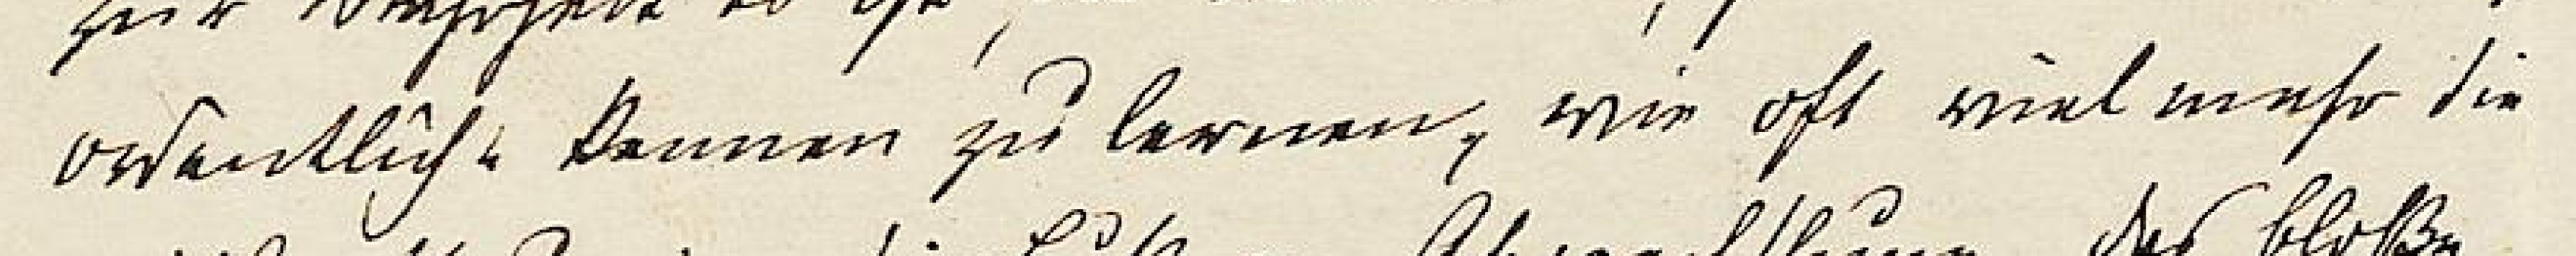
ordentliche kennen zu lernen, wie oft viel mehr die
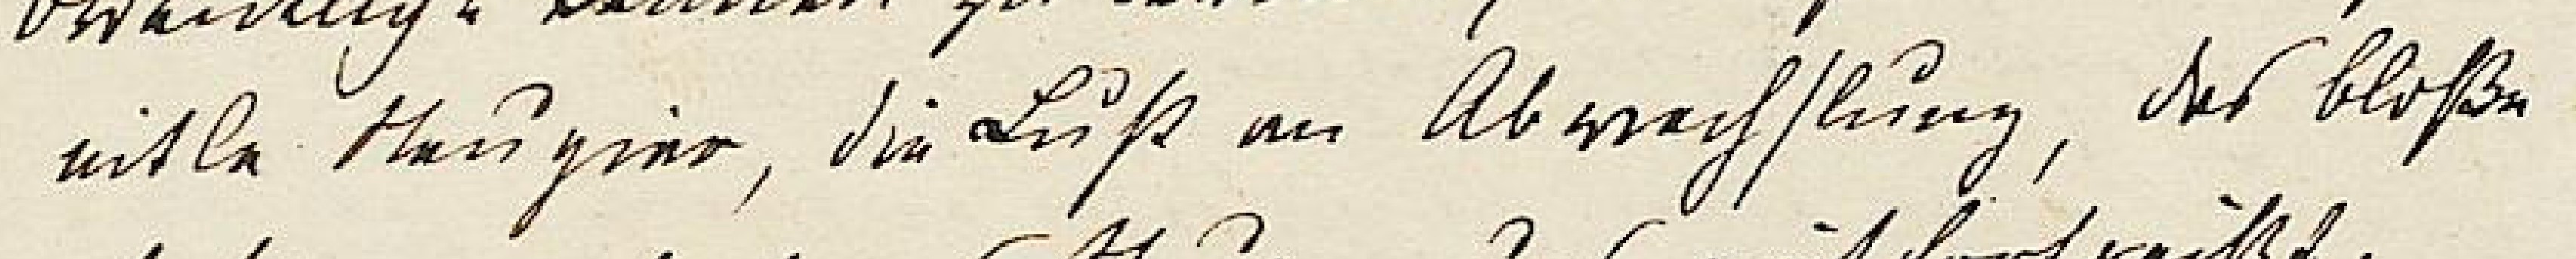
eitle Neugier, die Lust an Abwechslung, das blosße
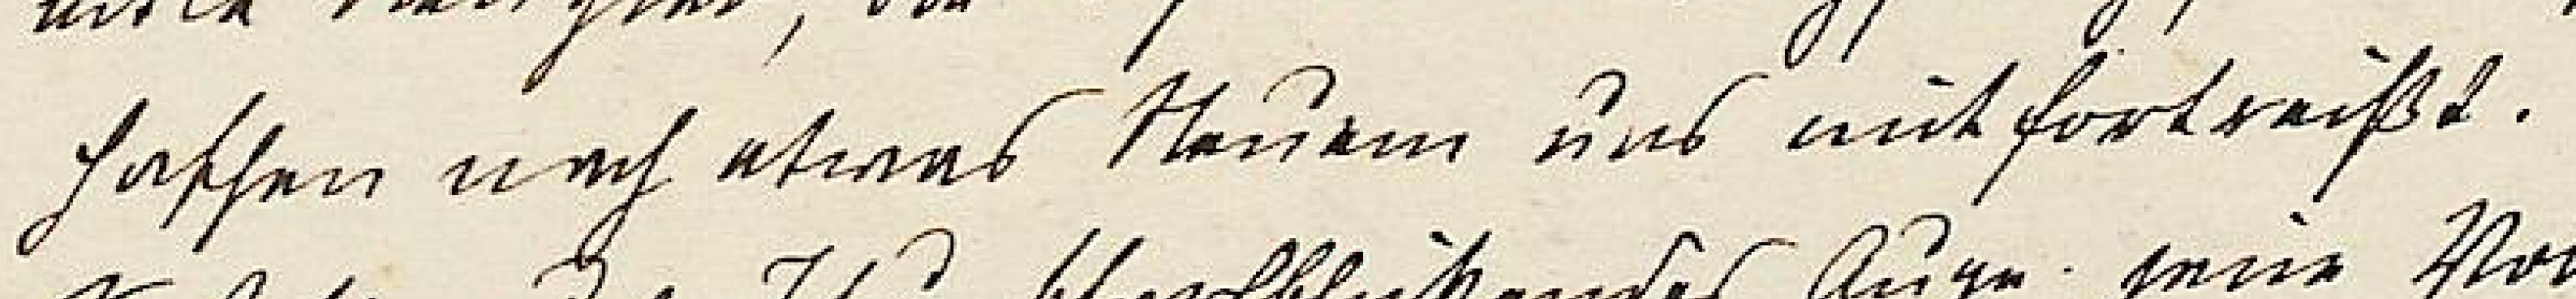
haschen nach etwas Neuem uns mit fortrreißt.
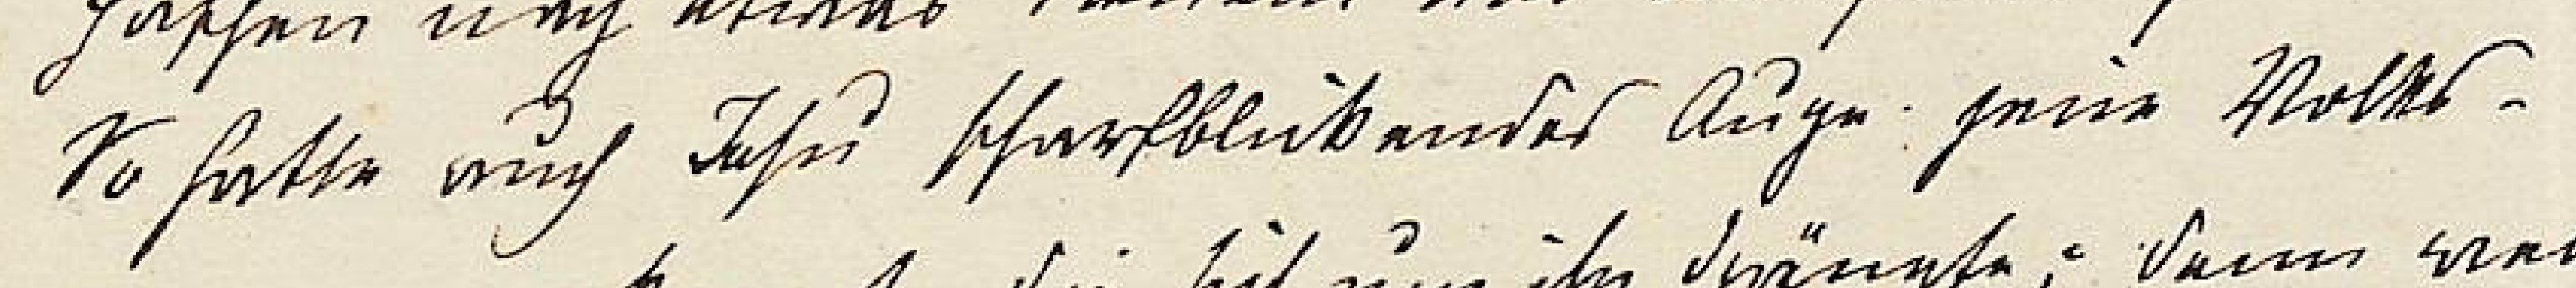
So hatte auch Jesu scharfblickendes Auge jene Volks¬
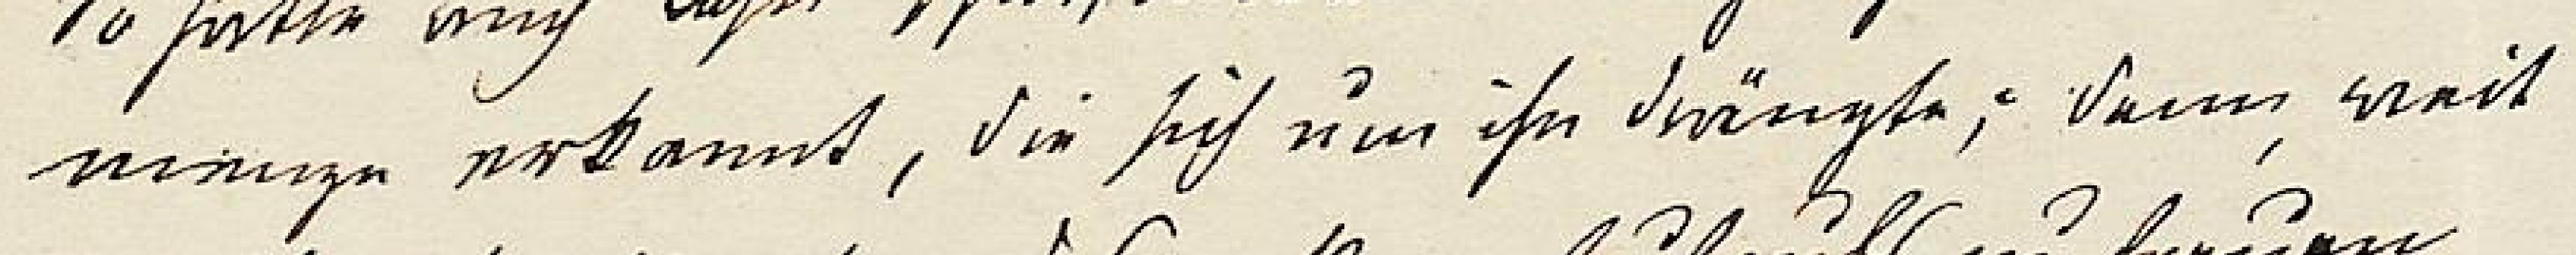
menge erkannt, die sich um ihn drängte; denn weit
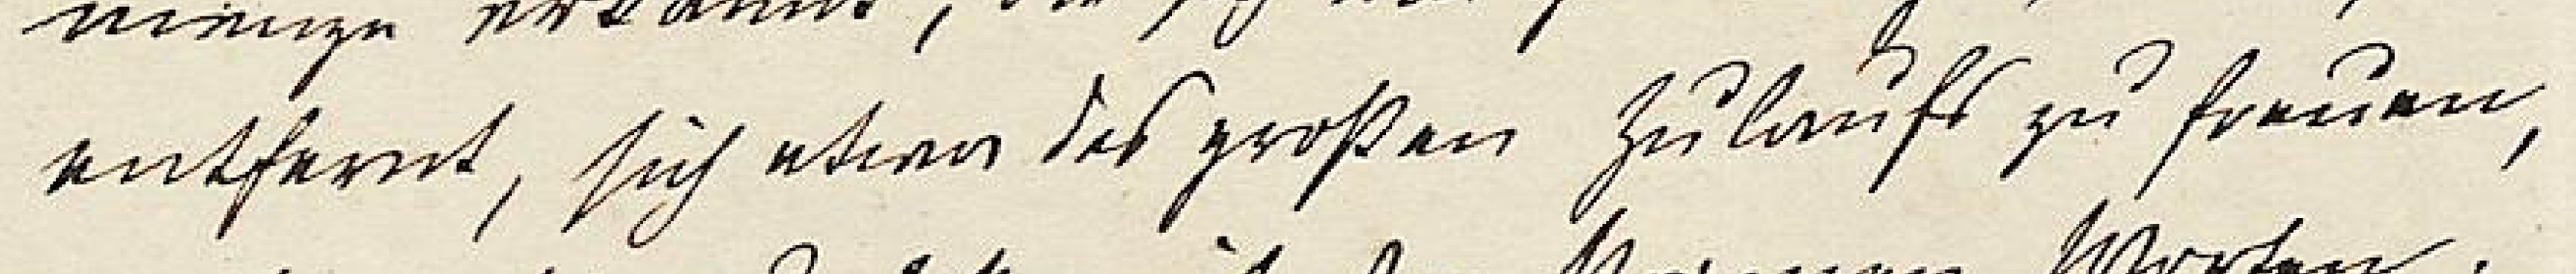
entfernt, sich etwa des großen Zulaufs zu freuen,
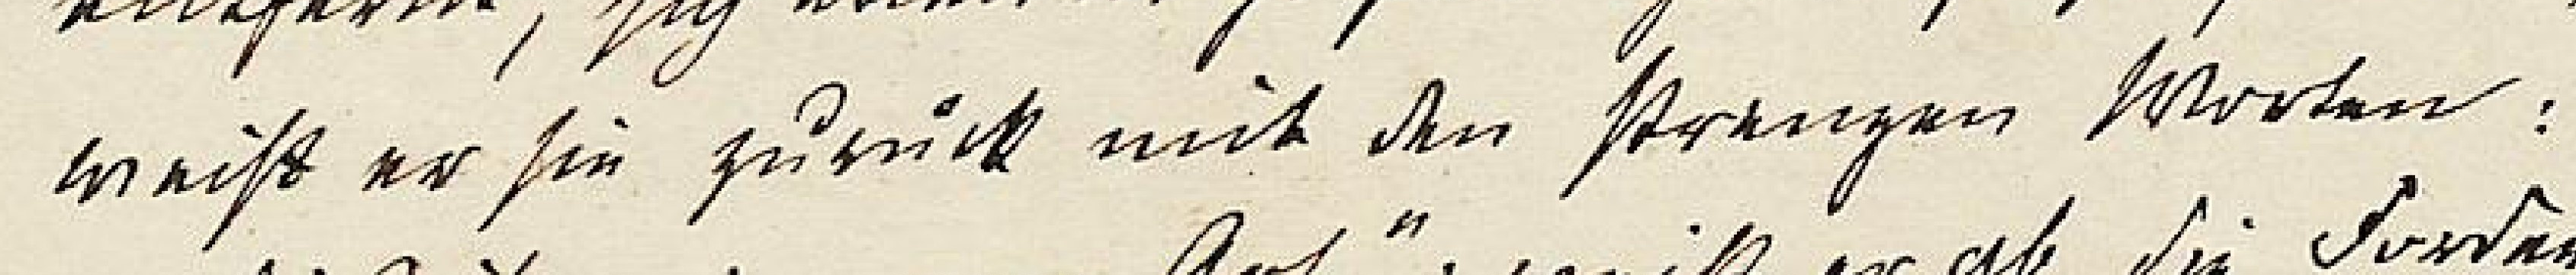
weißt er sie zurück mit den strengen Worten:
